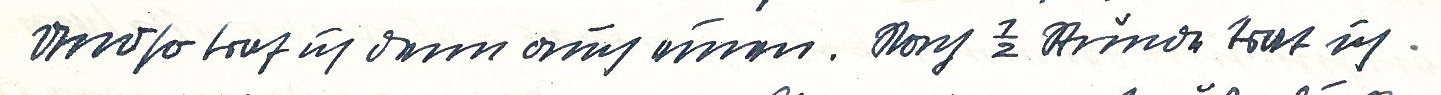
Und so traf ich denn auch einen. Nach ½ Stunde trat ich
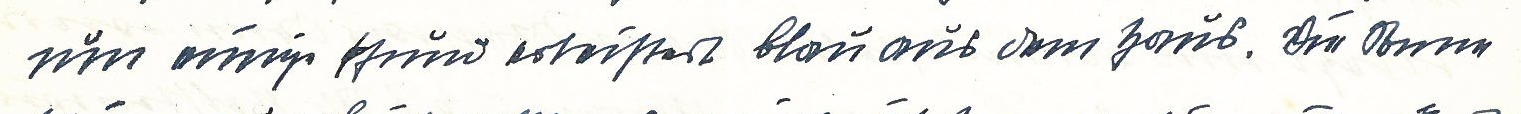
um einige Pfund erleichtert blau aus dem Haus. Die Sonne
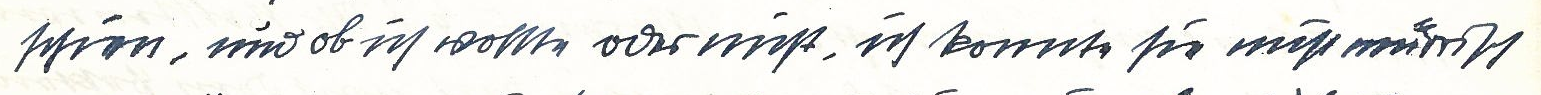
schien, und ob ich wollte oder nicht, ich konnte sie nicht mürrisch
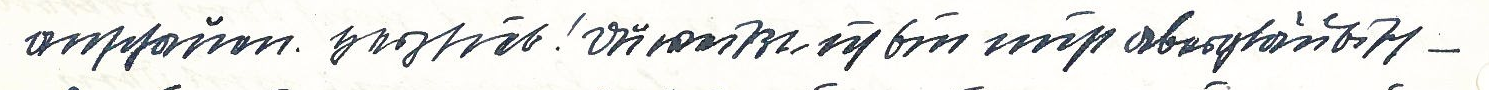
anschauen. Herzlieb! Du weißt, ich bin nicht abergläubisch –
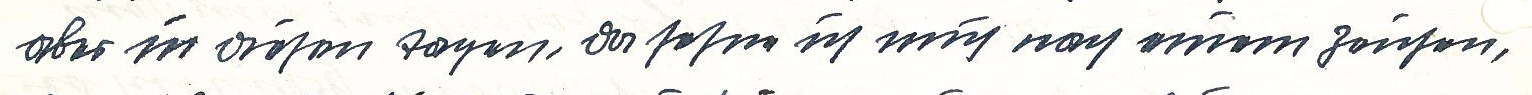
aber in diesen Tagen, da sehne ich mich nach einem Zeichen,
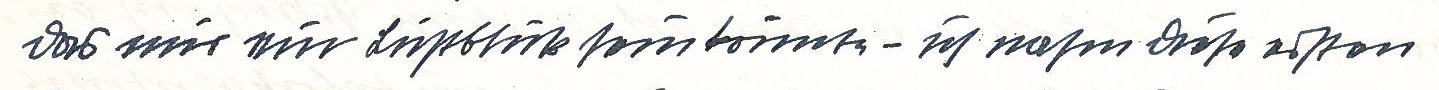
daß mir ein Lichtblick sein könnte – ich nahm diese ersten
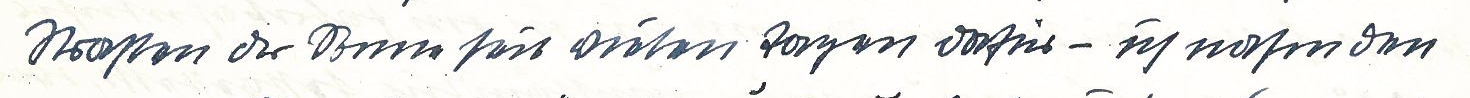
Strahlen der Sonne seit vielen Tagen dafür – ich nahm den
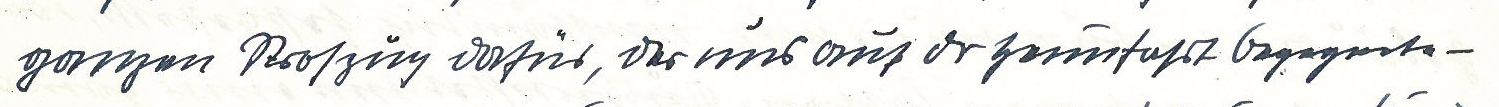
ganzen Strohzug dafür, der uns auf der Heimfahrt begegnete –
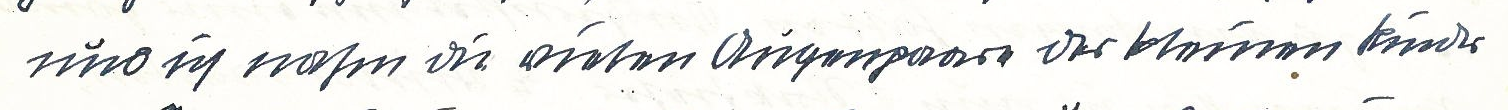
und ich nahm die vielen Augenpaare der kleinen Kinder
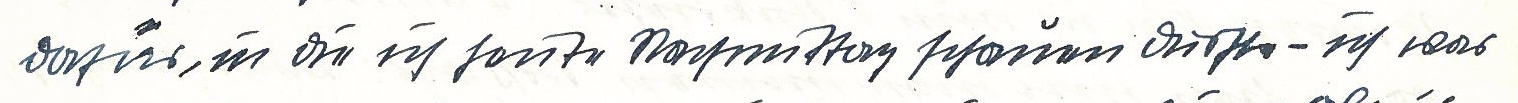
dafür, in die ich heute Nachmittag schauen durfte – ich war
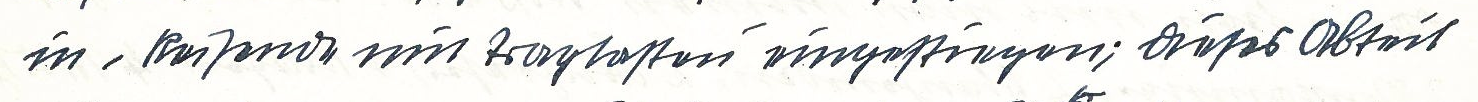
in ‚Reisende mit Traglasten’ eingestiegen; dieses Abteil
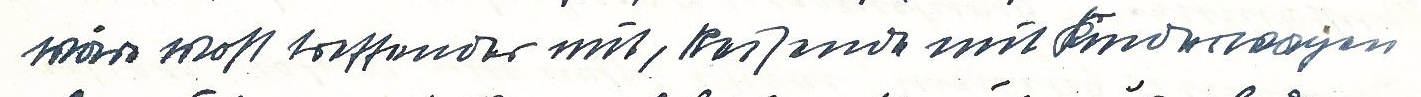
wäre wohl treffender mit ‚Reisende mit Kinderwagen
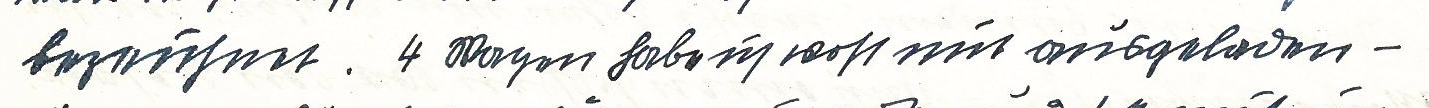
bezeichnet. 4 Wagen habe ich wohl mit ausgeladen –
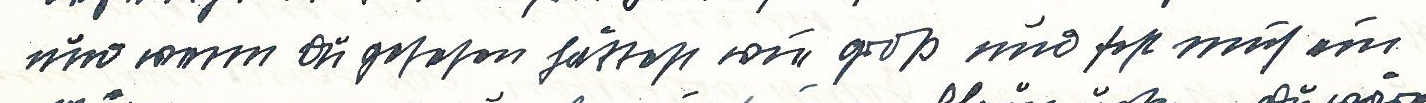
und wenn Du gesehen hättest wie groß und fest mich ein
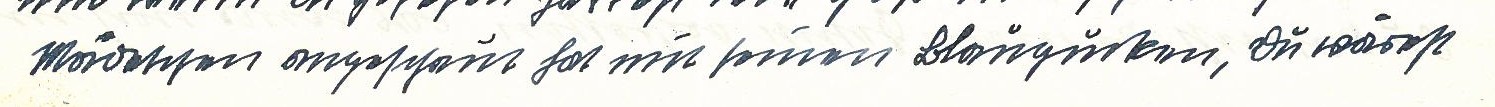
Mädchen angeschaut hat mit seinen Blaugucken, Du wärst
